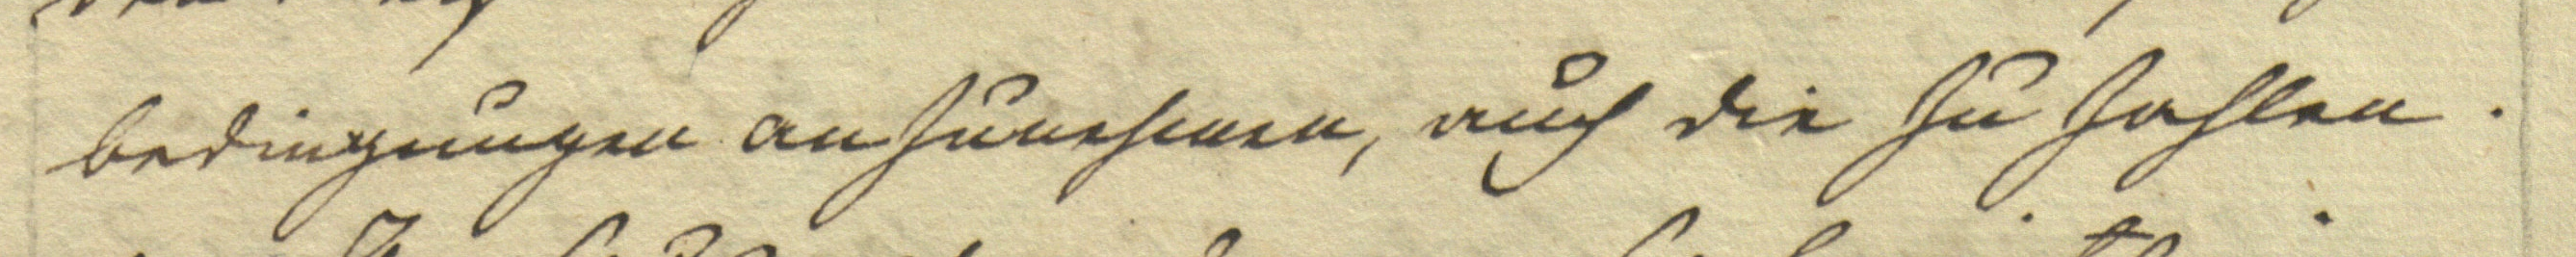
bedingungen anzunehmen, auch die zu zahlen¬
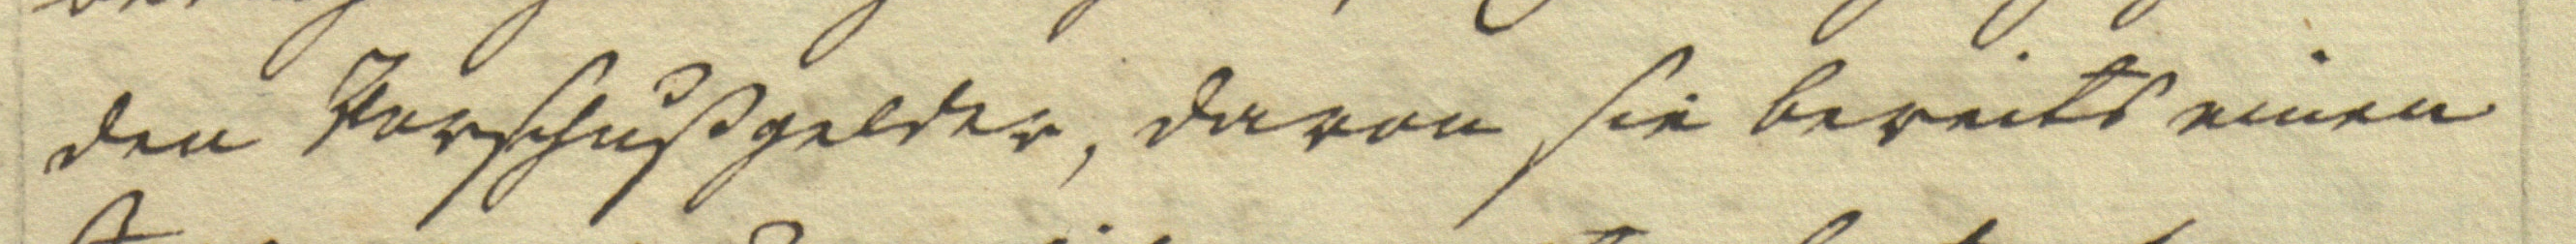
den Vorschußgelder, davon sie bereits einen
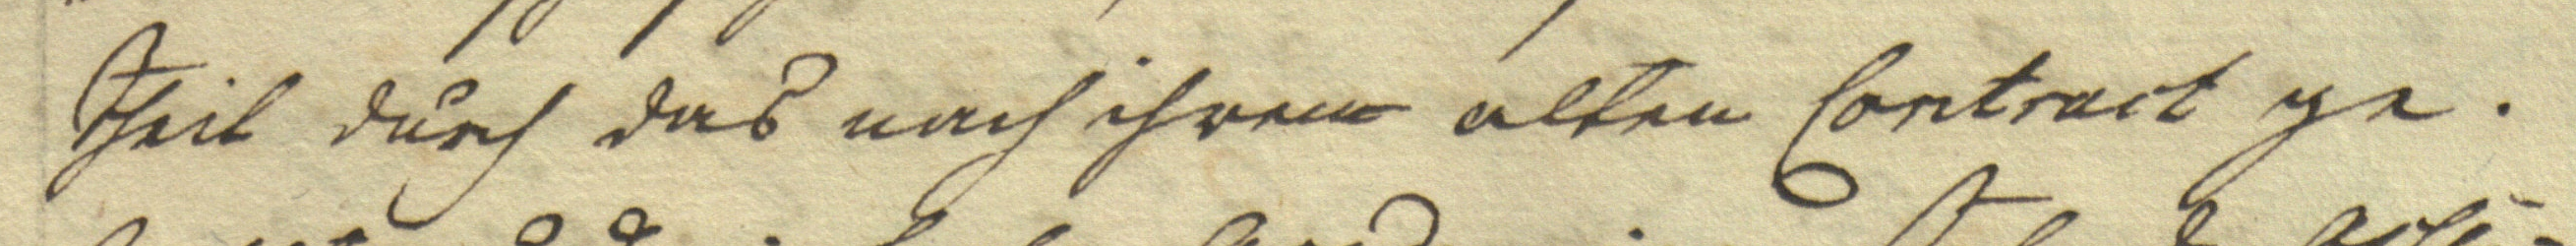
Theil durch das nach ihrem alten Contract ge¬
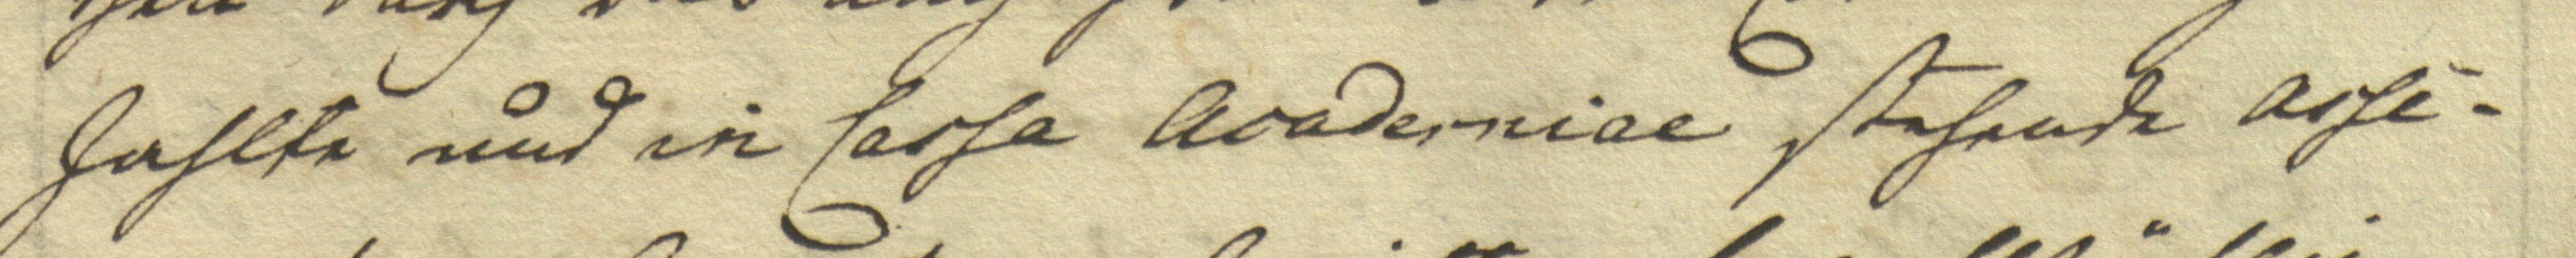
zahlte und in Cassa Academiae stehende Asse
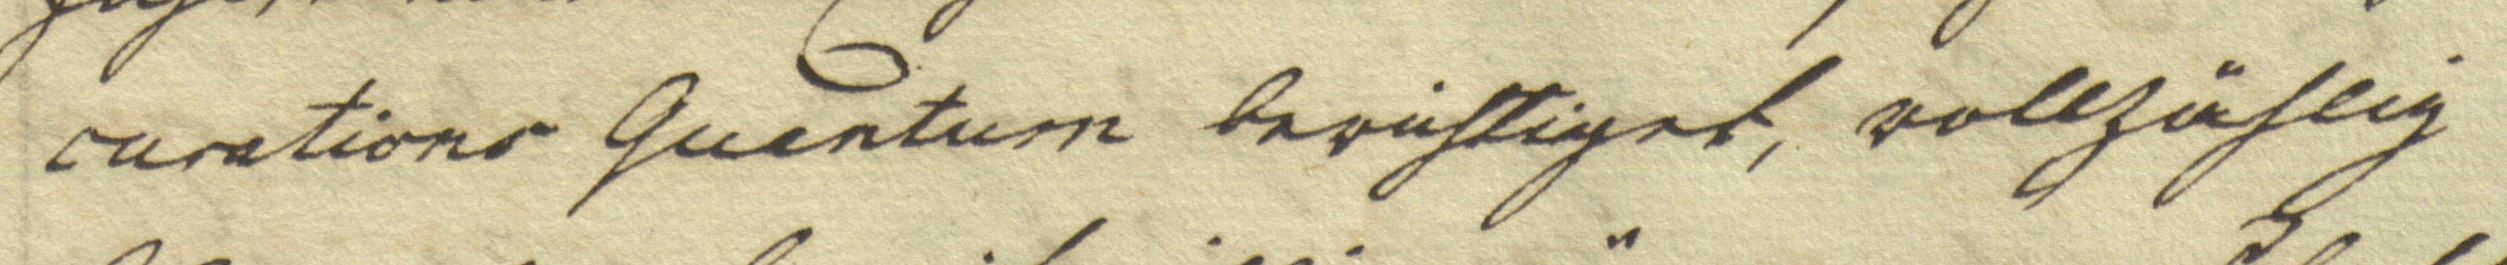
curations Quantum berichtiget, vollzählig
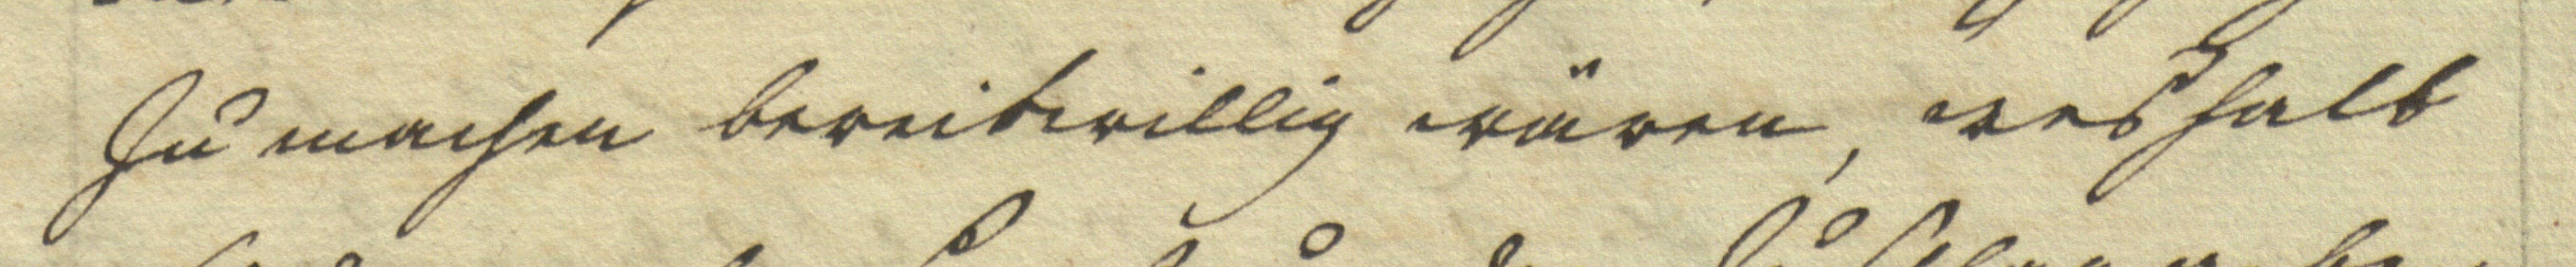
zu machen bereitwillig wären weshalb
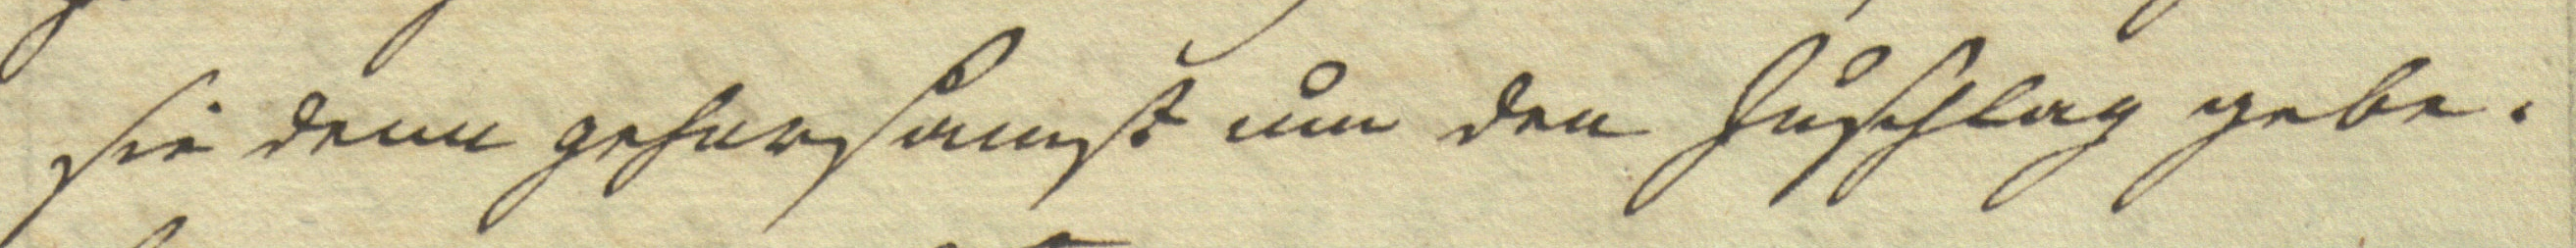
sie denn gehorsamst um den Zuschlag gebe¬
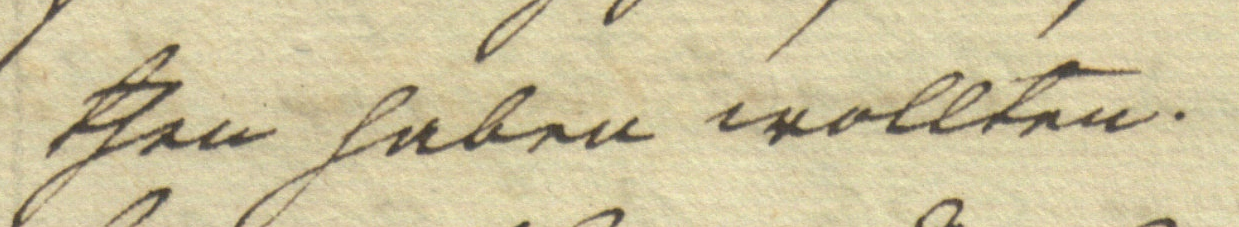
then haben wollten.
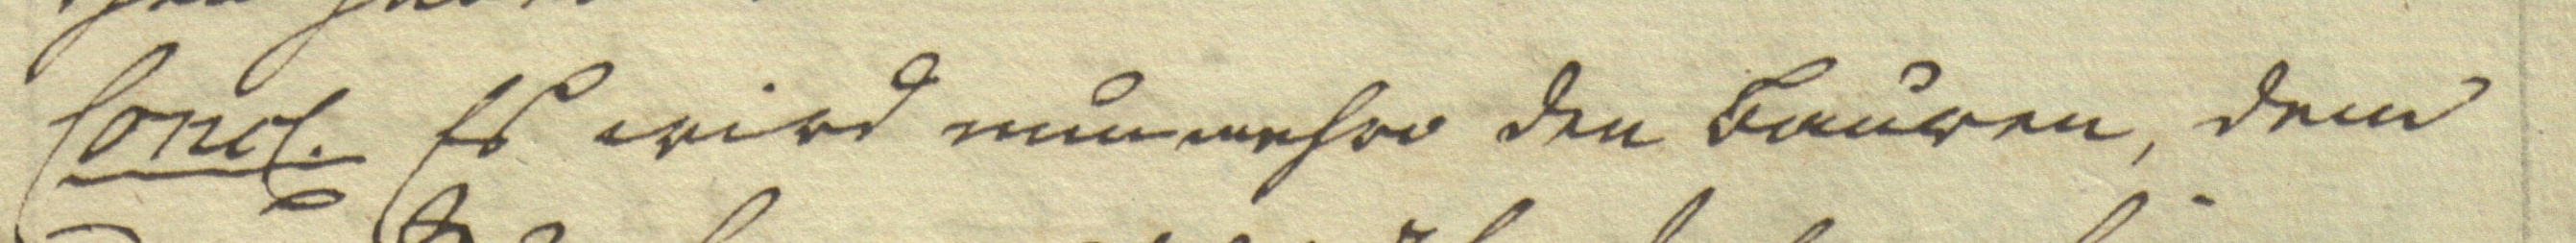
Concl. Es wird nunmehro den Bauren, dem
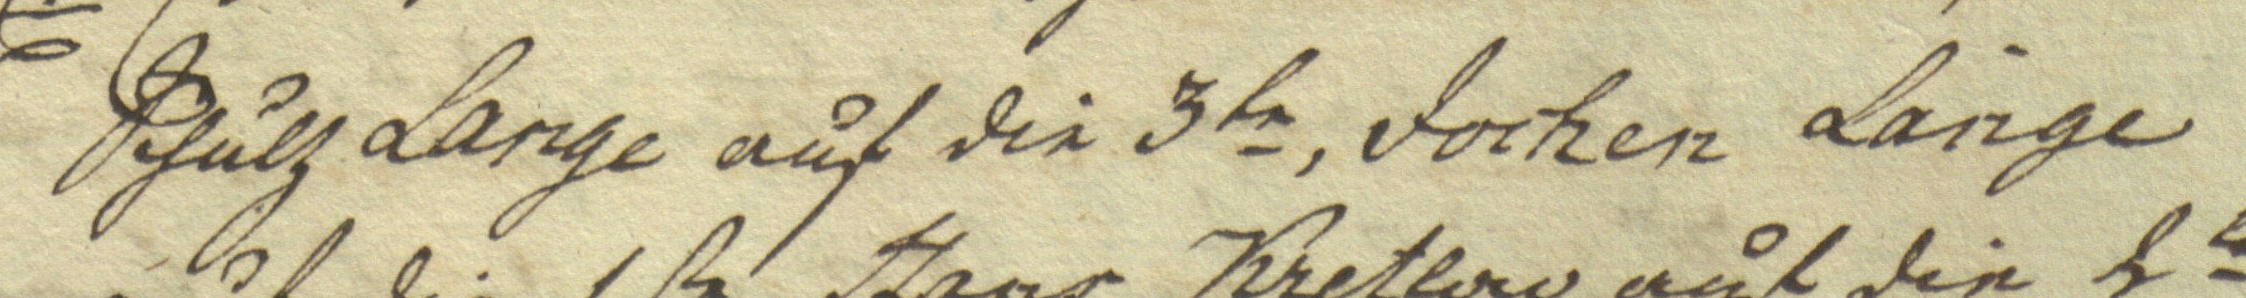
Schulz Lange auf die 3 te, Jochen Lange
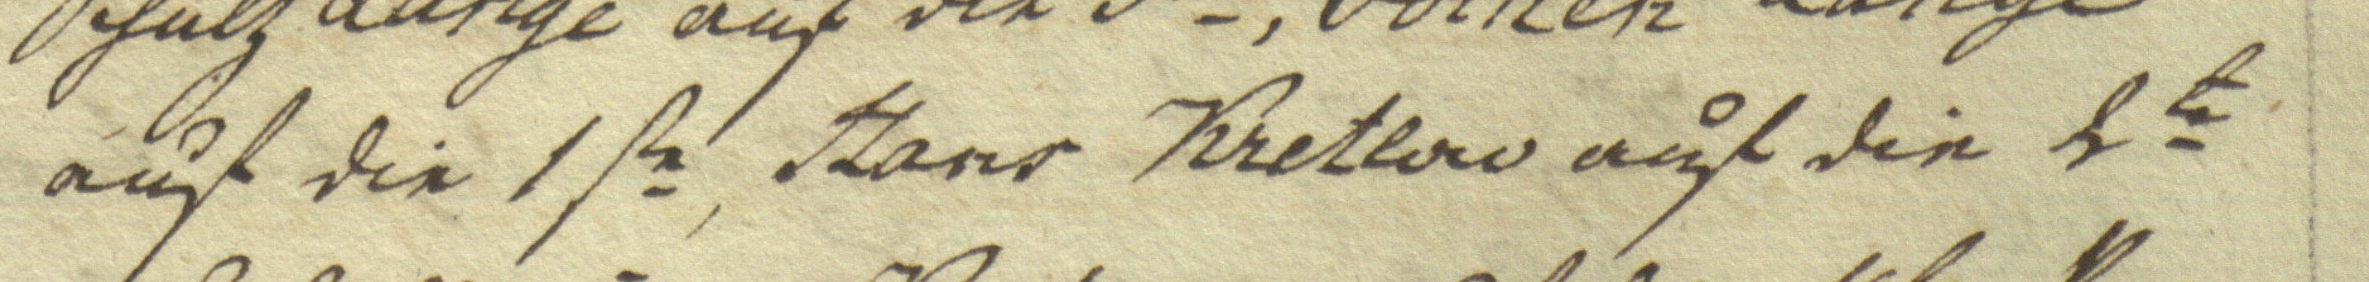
auf die 1 ste, Hans Kretlow auf die 2 te
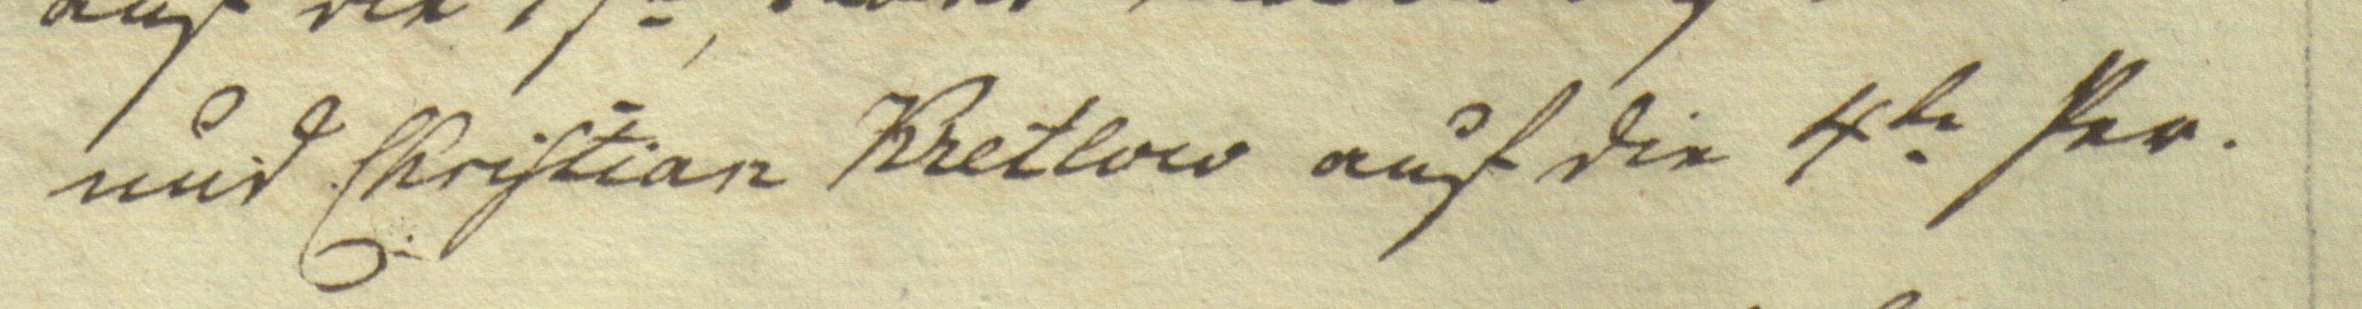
und Christian Kretlow auf die 4 te. Per¬
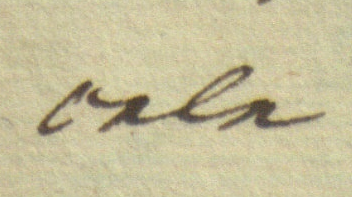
cele
